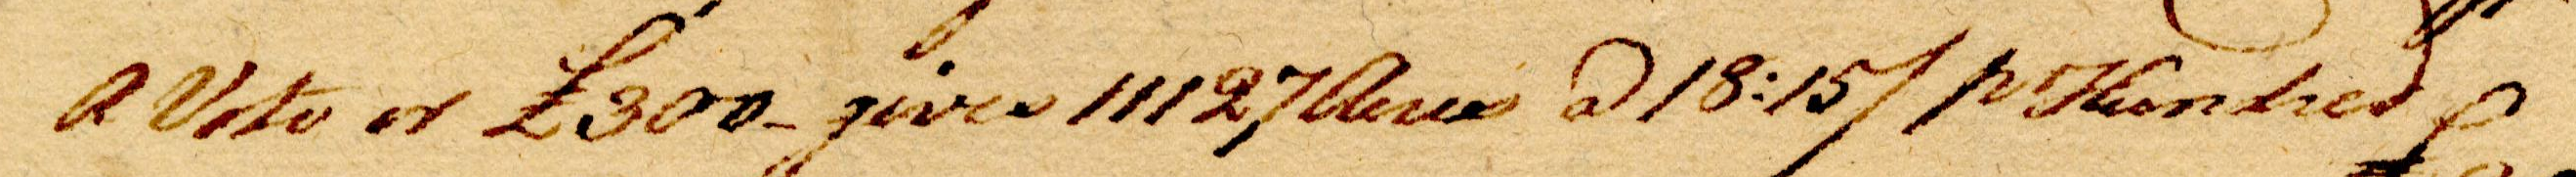A vote or £300 gives 11127 acres @ 18:15s p^r Hundred
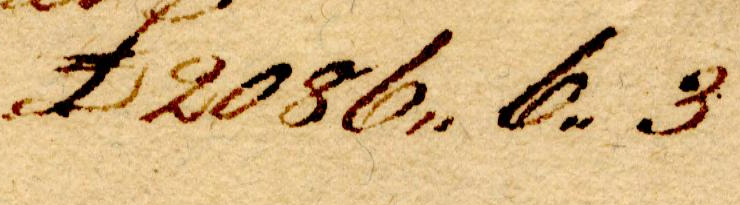£2086.6.3
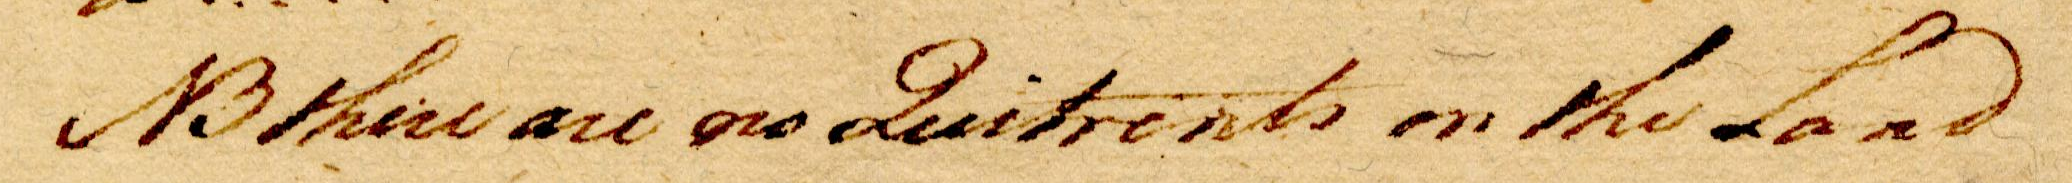NB there are no Quitrents on the Land
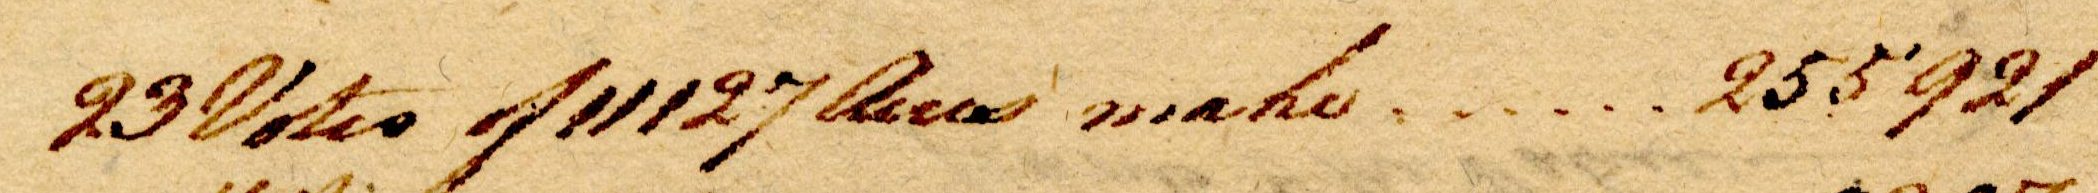23 Votes of 11127 acres make ...... 255921
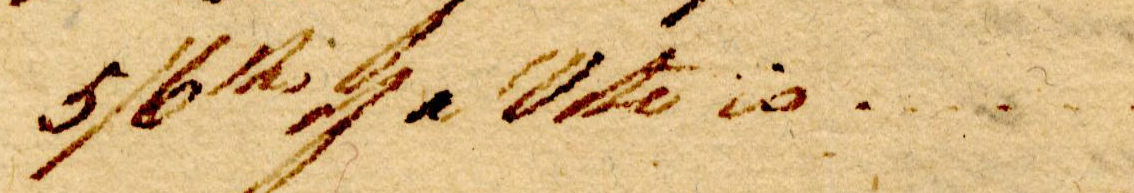5/6^th of a vote is....
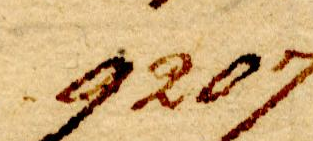9207
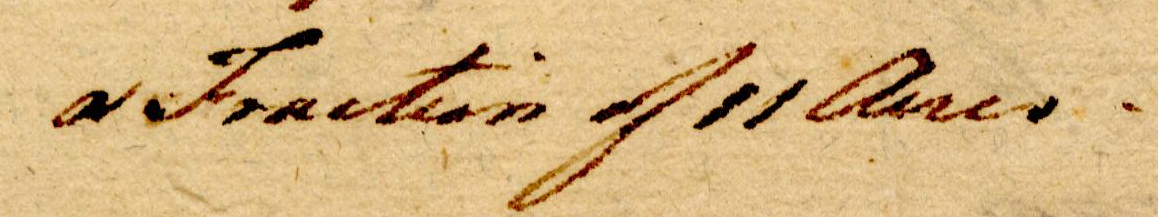a Fraction of 11 Acres
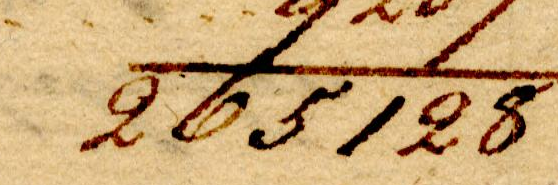265128
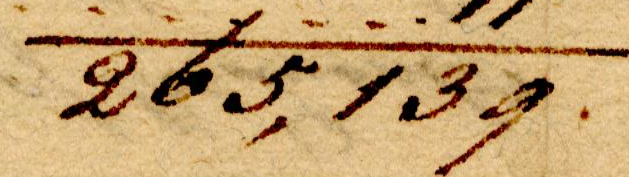265,139
